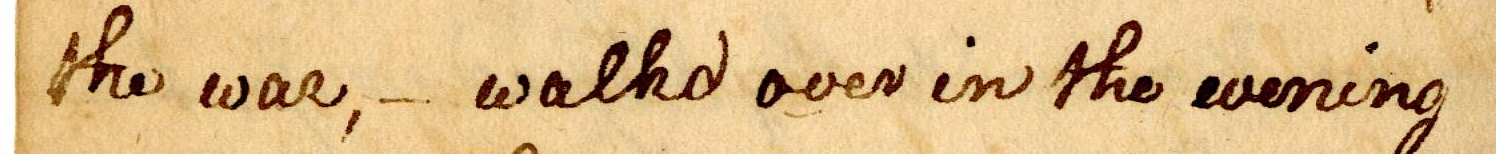the war- walkd over in the evening
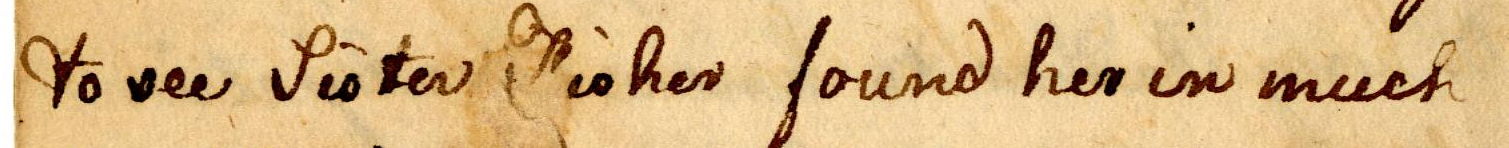to see Sister Fisher found her in much
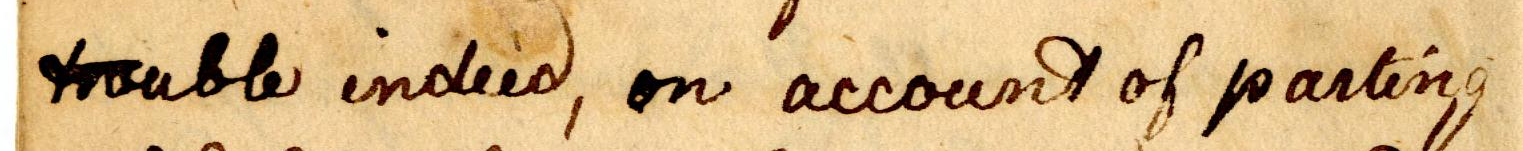trouble indeed, on account of parting
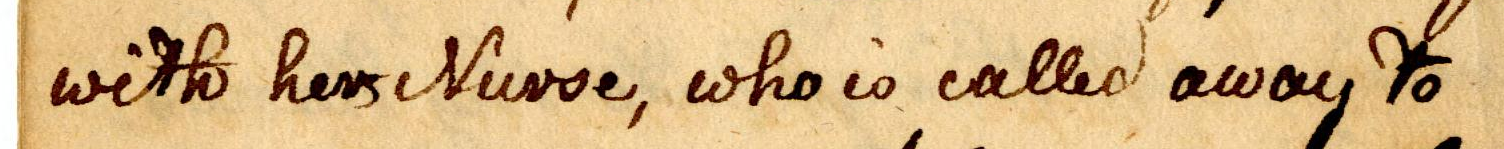with her Nurse, who is called away to
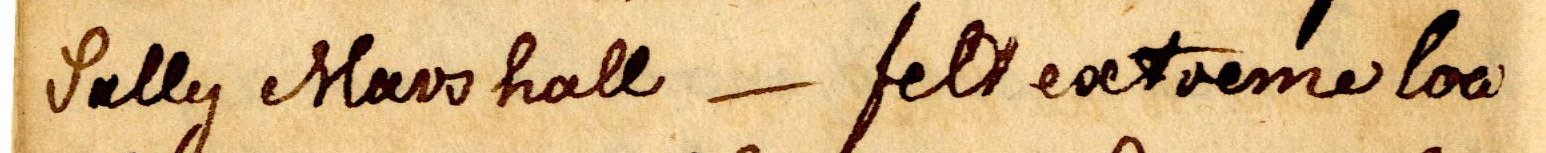Sally Marshall- felt extreme low
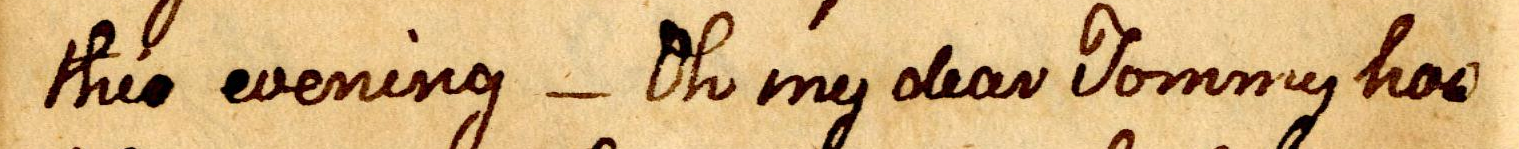this evening- Oh my dear Tommy has
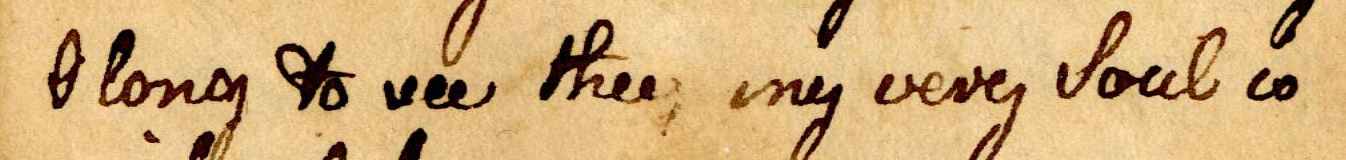I long to see thee, my very Soul is
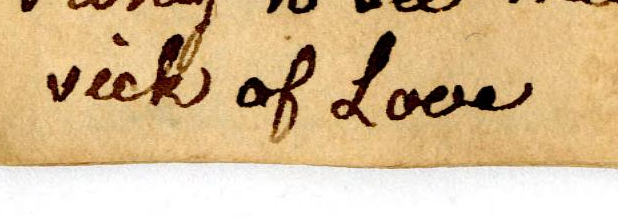sick of Love-
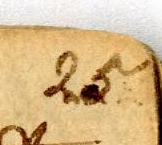25
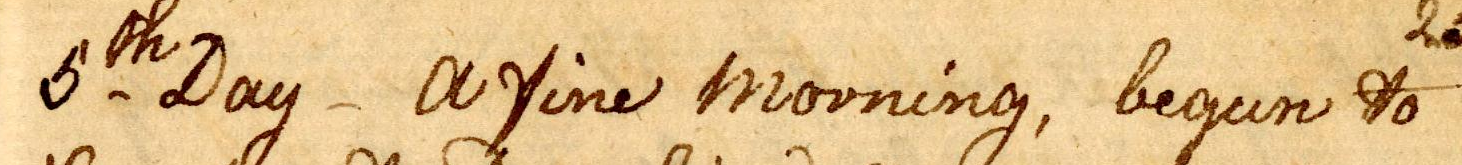5^th Day- A fine Morning, begun to
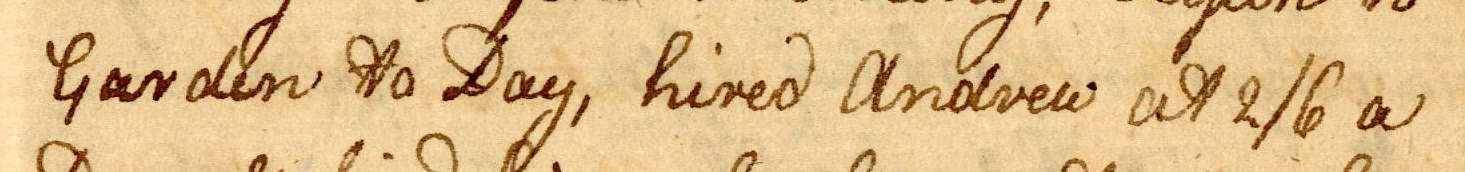Garden to Day, hired Andrew at 2s6 a
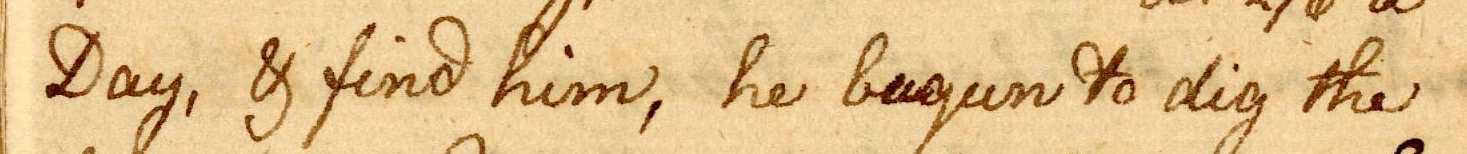Day, & find him, he bugun to dig the
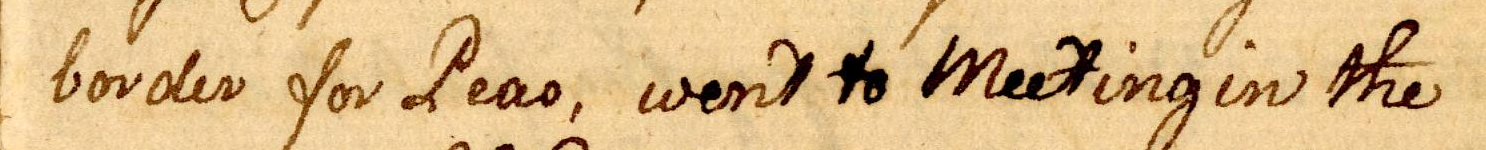border for Peas, went to Meeting in the
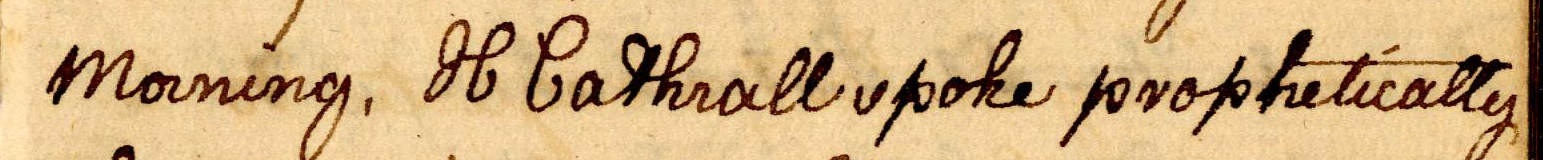Morning, H Cathrall spoke prophetically
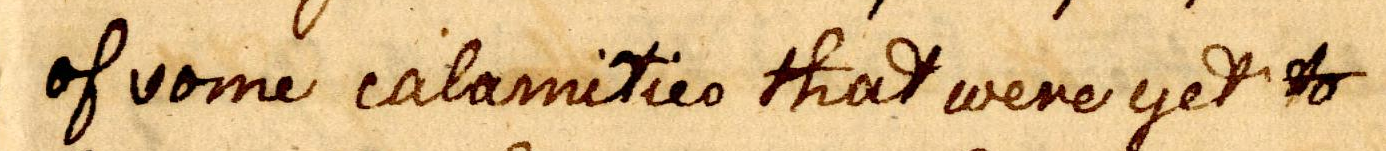of some calamities that were yet to
